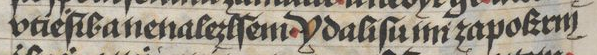vtieẛil.a nenalezlsem.Ydalisu mi zapokrm
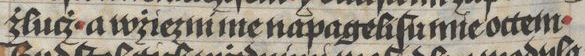żlucż.a wżiezni me nageli ſu mie octem.
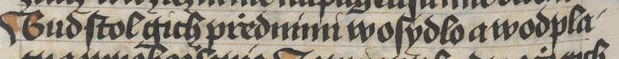Bud ſtol gich pṙednimi woſydlo a wodpla¬
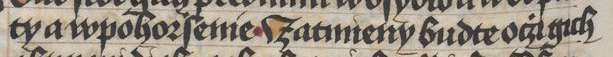ty a wpokoṙenie.Zatmieny budte ocżi gich
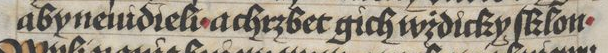aby neuidieli.achrzbet gich wżdicky ſklon.
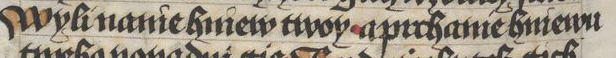Wyli nanie hniew twoy.aprchaníe hniewu
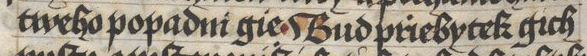tweho popadni gie.Bud pṙiebytek gich
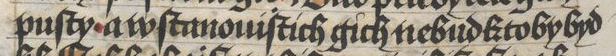puſty.a wſtanouiẛtích gich nebudktoby byd¬
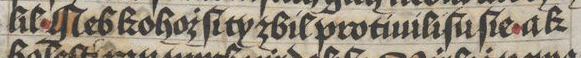lil.Neb kohoż ſi ty zbil protiuiliſu ſie.a k
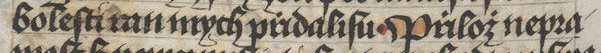bolesti ran mych pṙidali ſu.Pṙiloż nepra¬
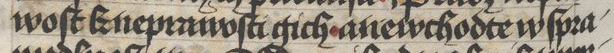woſt kneprawoſti gich.a newchodte v ſpra¬
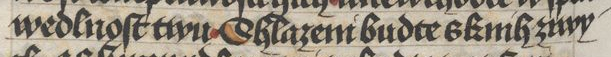wedlnoſt twu.Shlazeni budte sknih zrwy¬
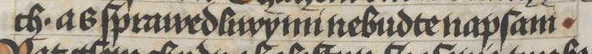ch.a sſprawedliwymi nebudte napſani.
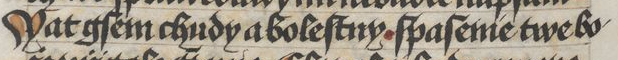Yat gſem chudy a boleſtny.ſpaſenie twe bo¬
